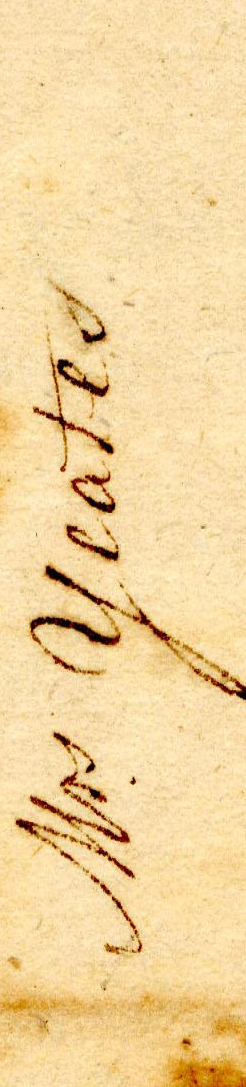M^rs. Yeates
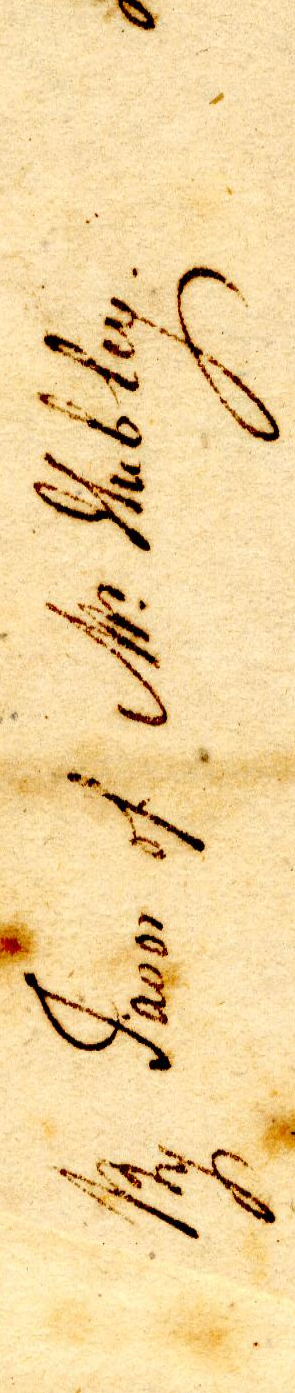By Favor of M^r. Hubley.
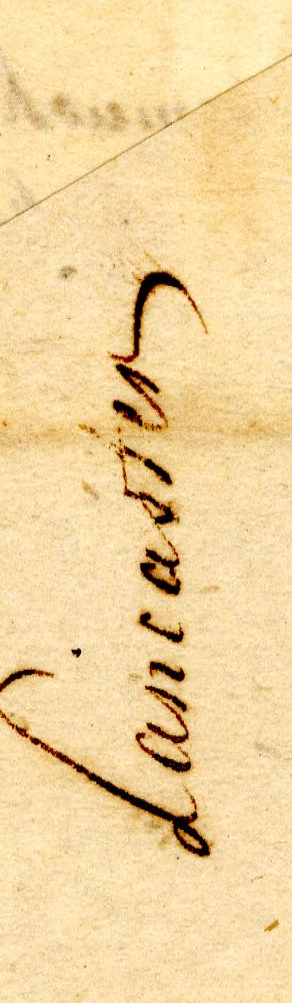Lancaster
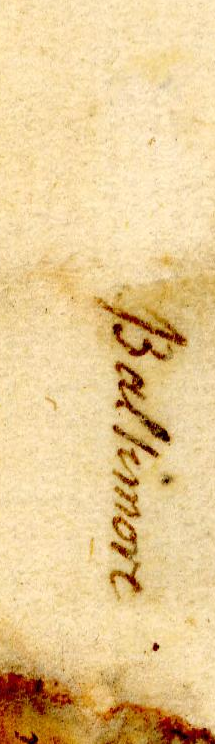Baltimore
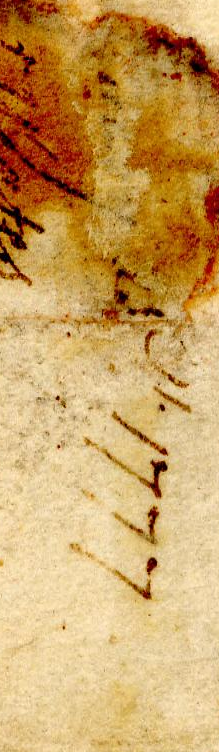^th 1777
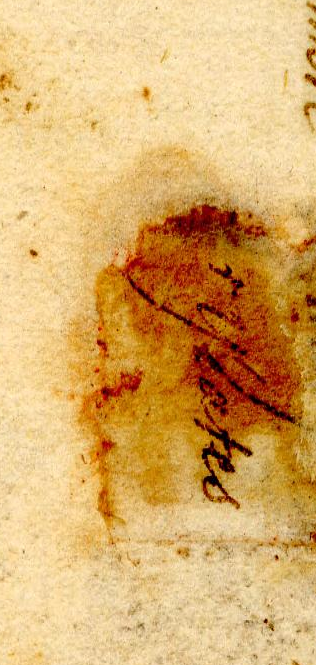Yeates
